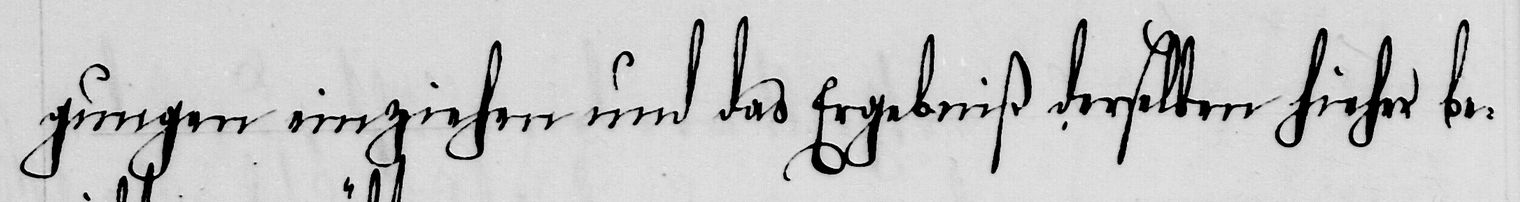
gungen einziehen und das Ergebniß derselben hieher b¬
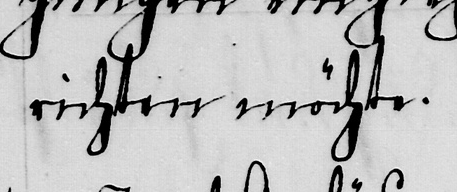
erichten möchte.
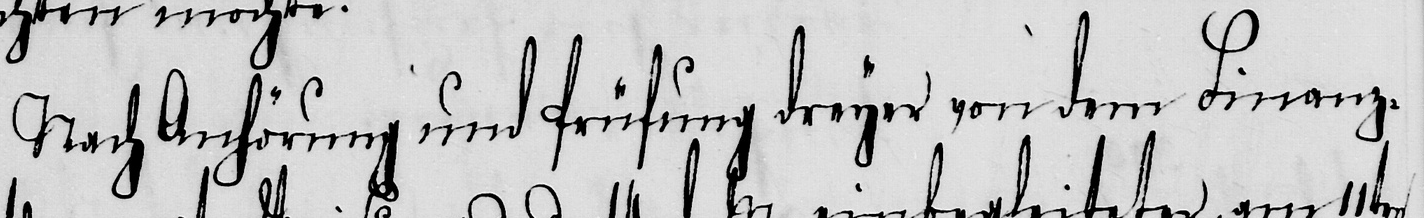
Nach Anhörung und Prüfung dreyer von dem Finanz¬
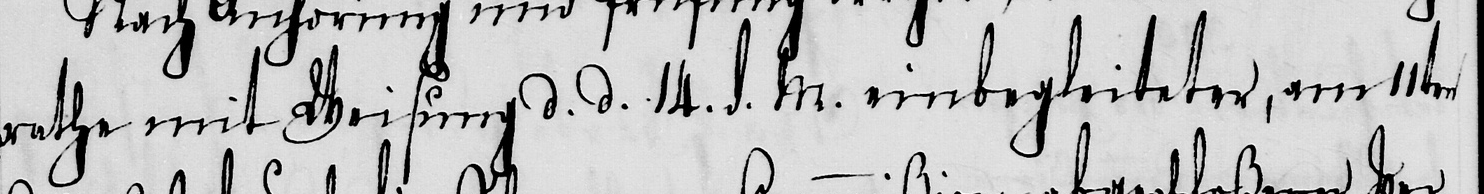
rathe mit Weisung d. d. 14. d. M. einegleiteter, am 11ten
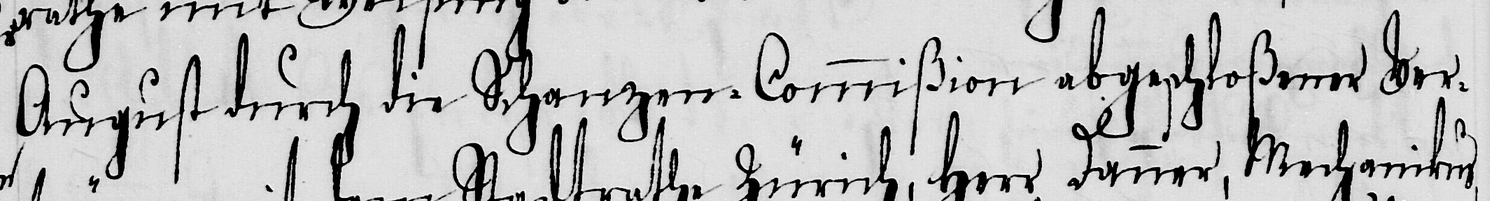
August durch die Schanzen-Commißion abgeschloßener Ver¬
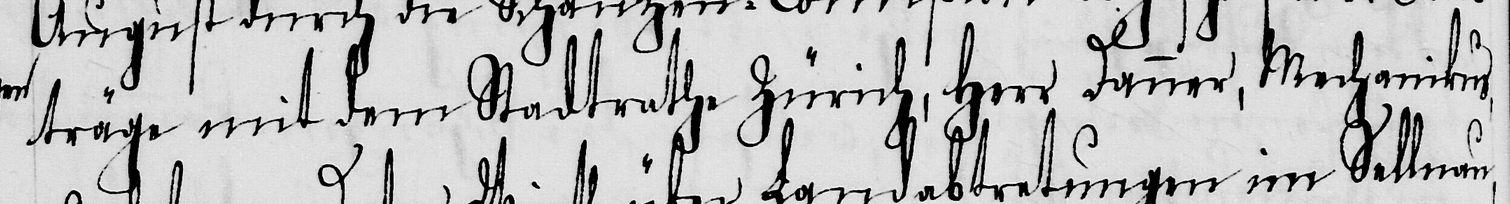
träge mit dem Stadtrathe Zürich, Herr Danner, Mechanikus,
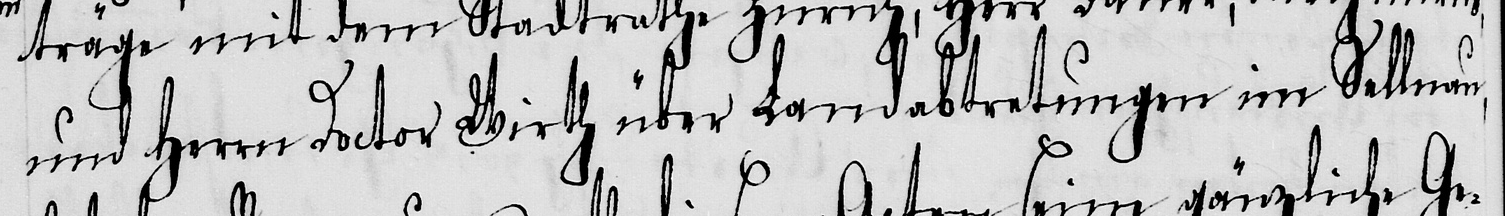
und Herrn Doctor Wirth über Landabtretungen im Sellnau,
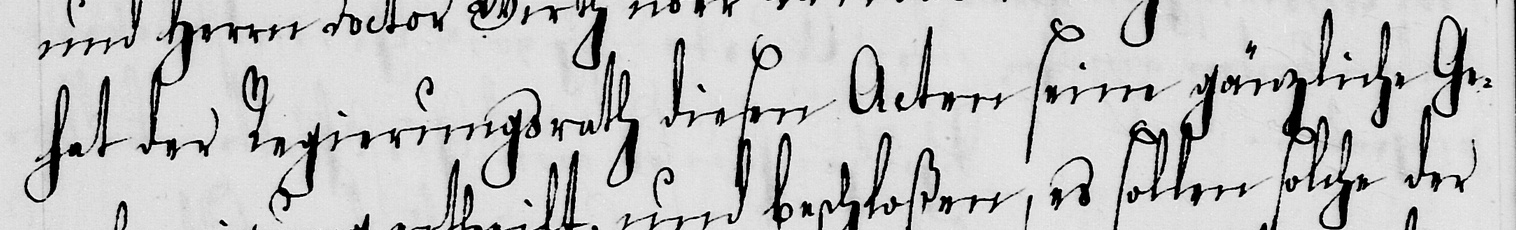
hat der Regierungsrath diesen Acten seine gänzliche Ge¬
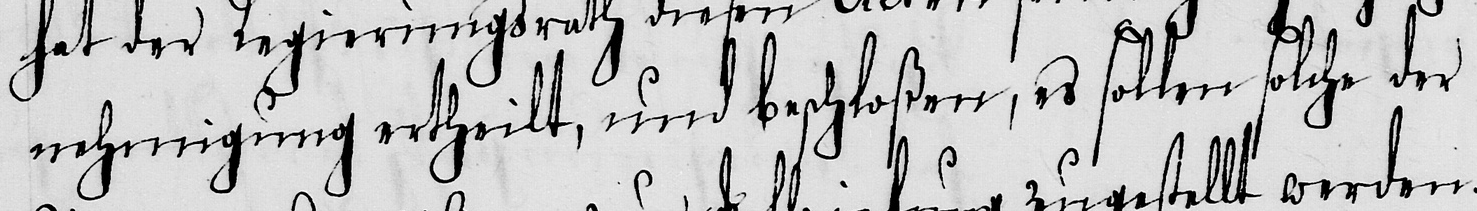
nehmigung ertheilt, und beschloßen, es sollen solche der
